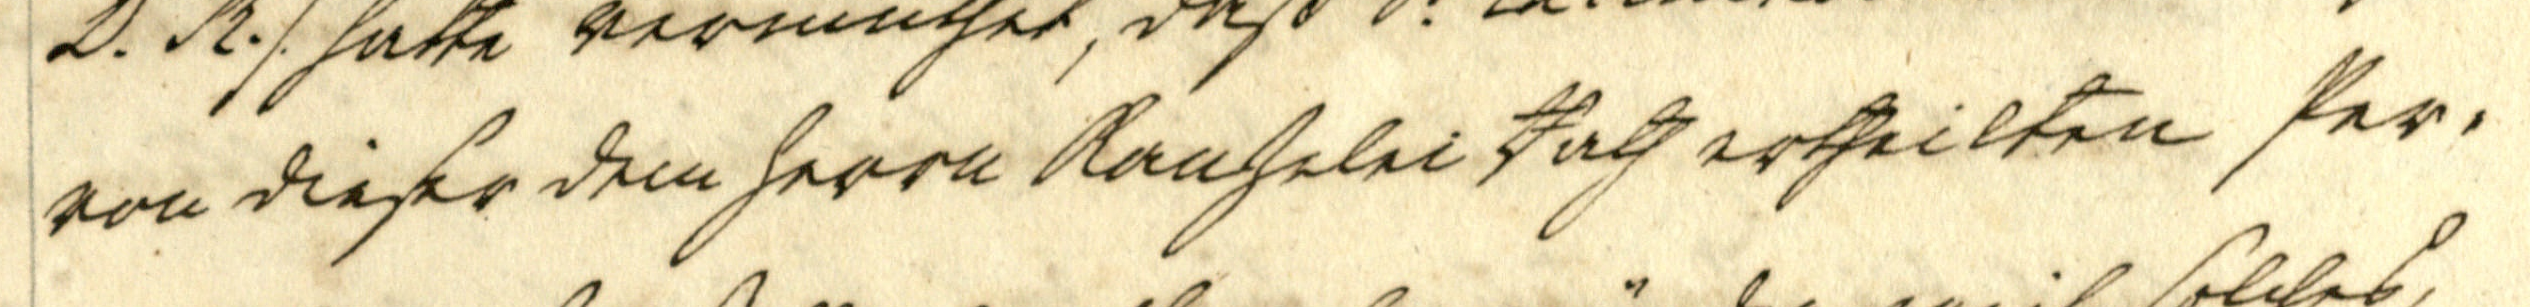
von dieser dem Herrn Kanzelei Rath ertheilten Per¬
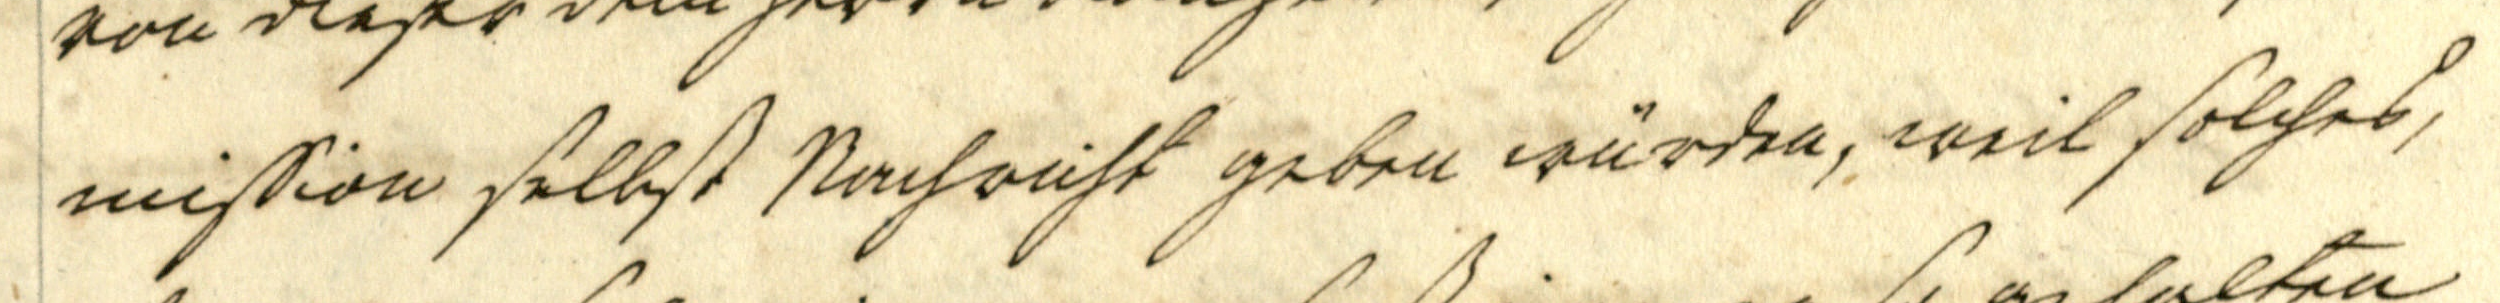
mission selbst Nachricht geben würden, weil solches,
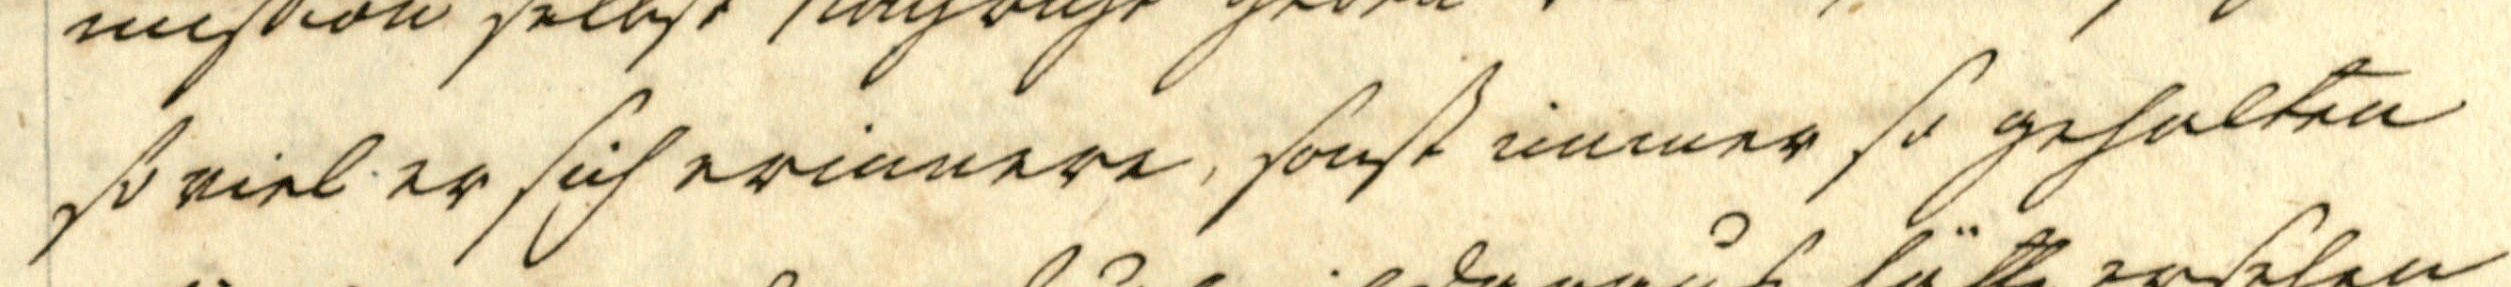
so viel er sich erinnere, sonst immer so gehalten
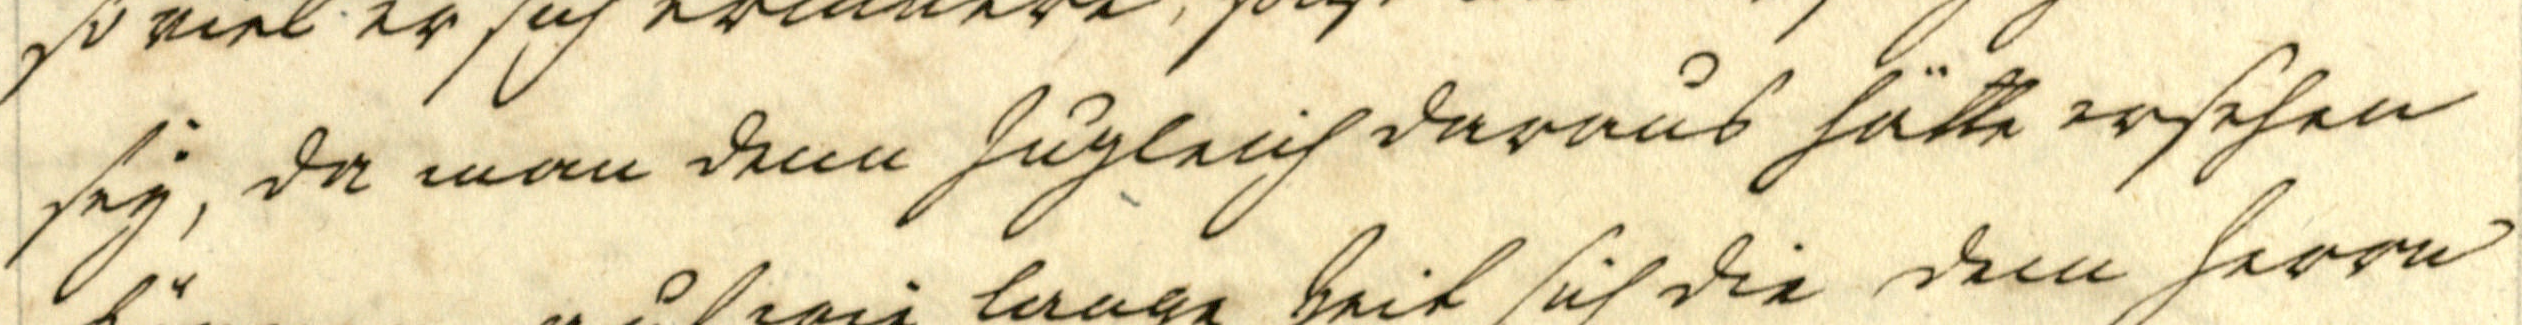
seÿ, da man denn zugleich daraus hätte ersehen
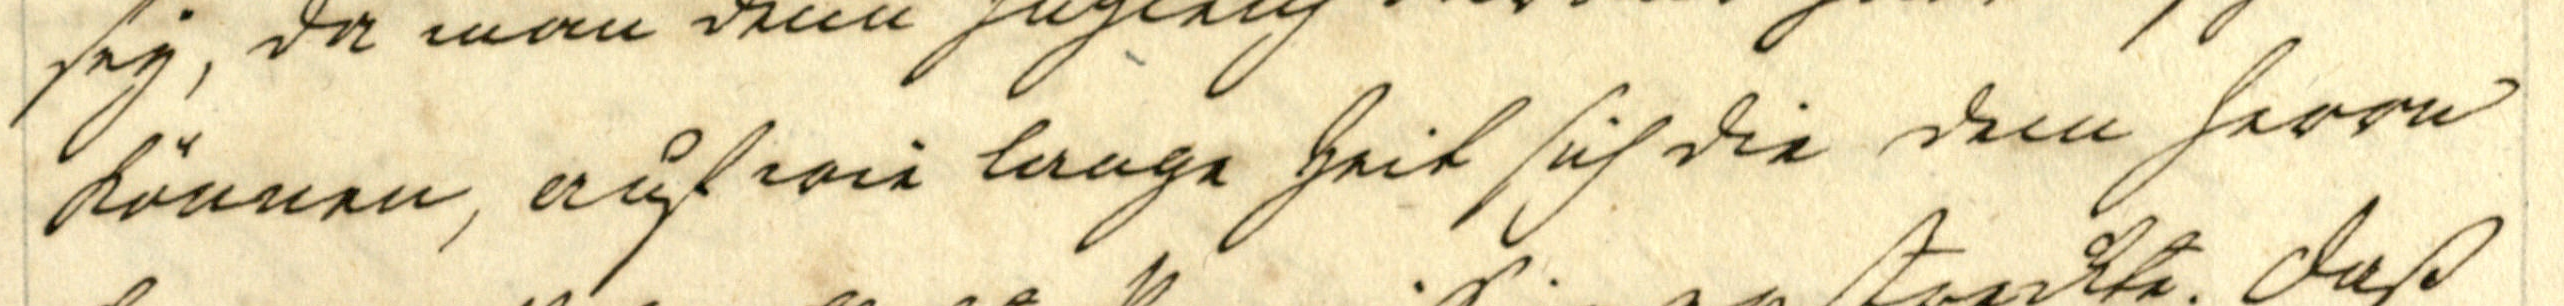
können, auf wie lange Zeit sich die dem Herrn
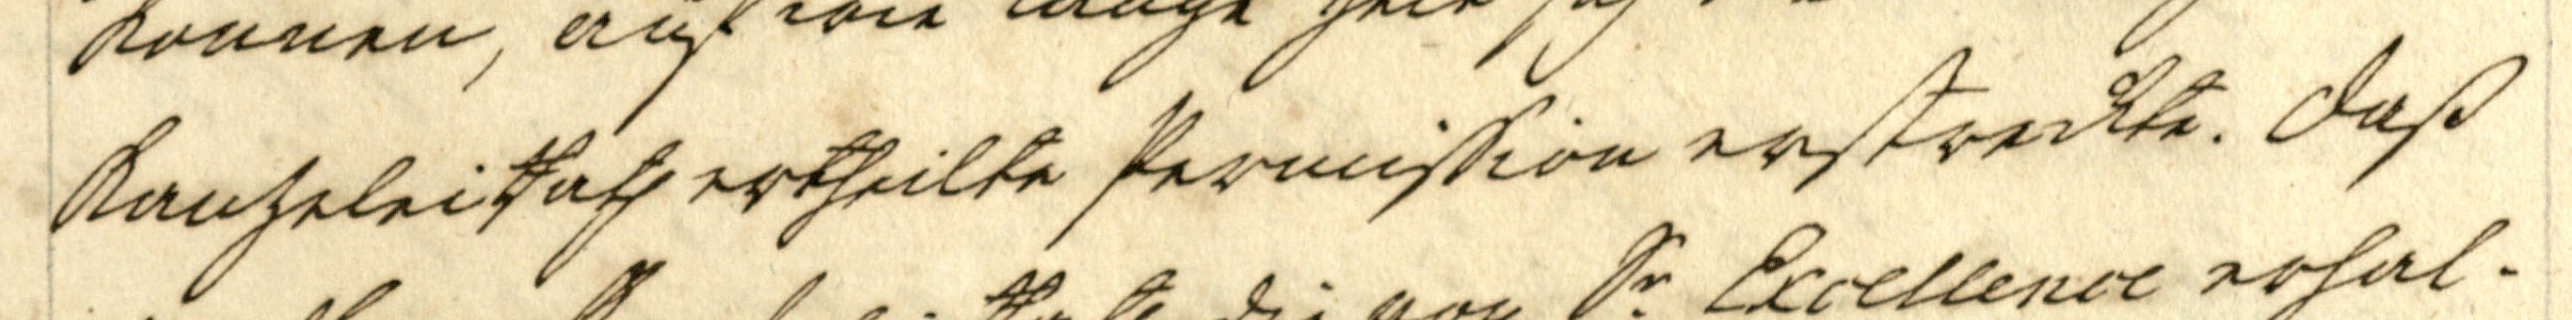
KanzeleiRath ertheilte Permission erstreckte. Daß
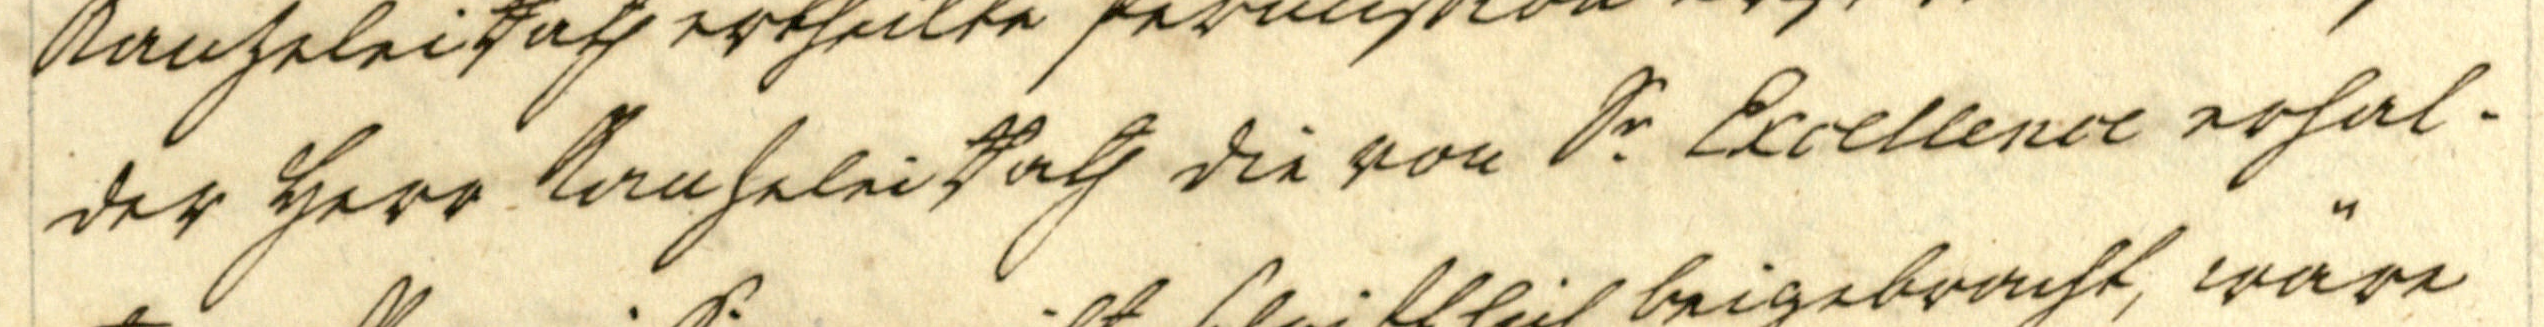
der Herr KanzeleiRath die von Sr Excellence erhal¬
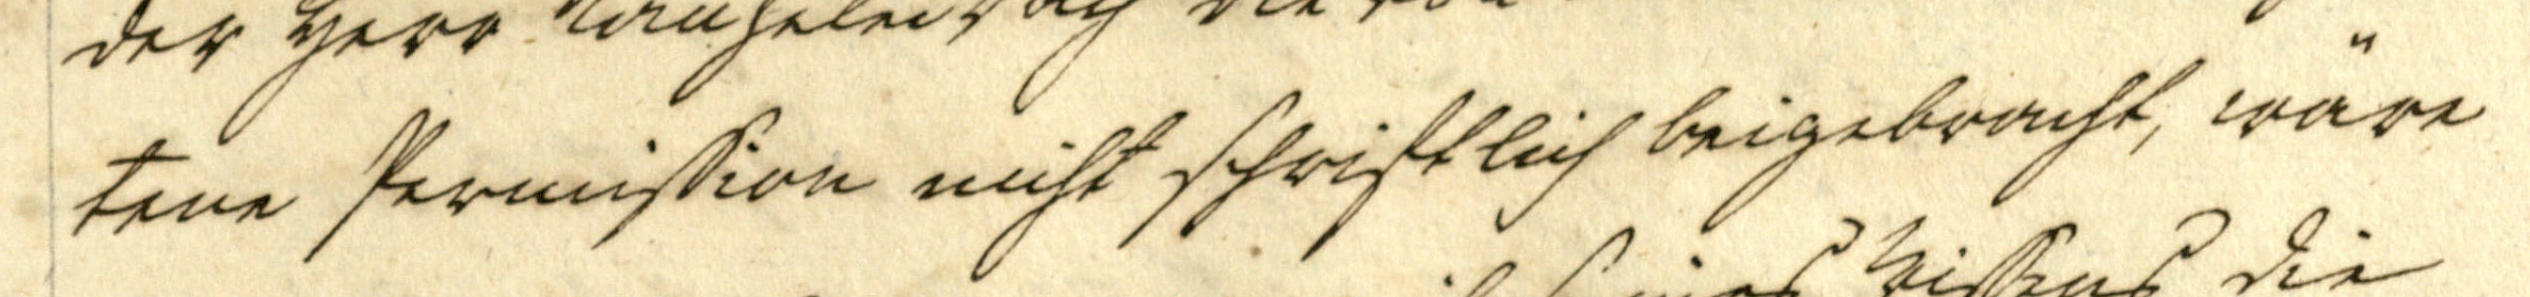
tene Permission nicht schriftlich beigebracht, wäre
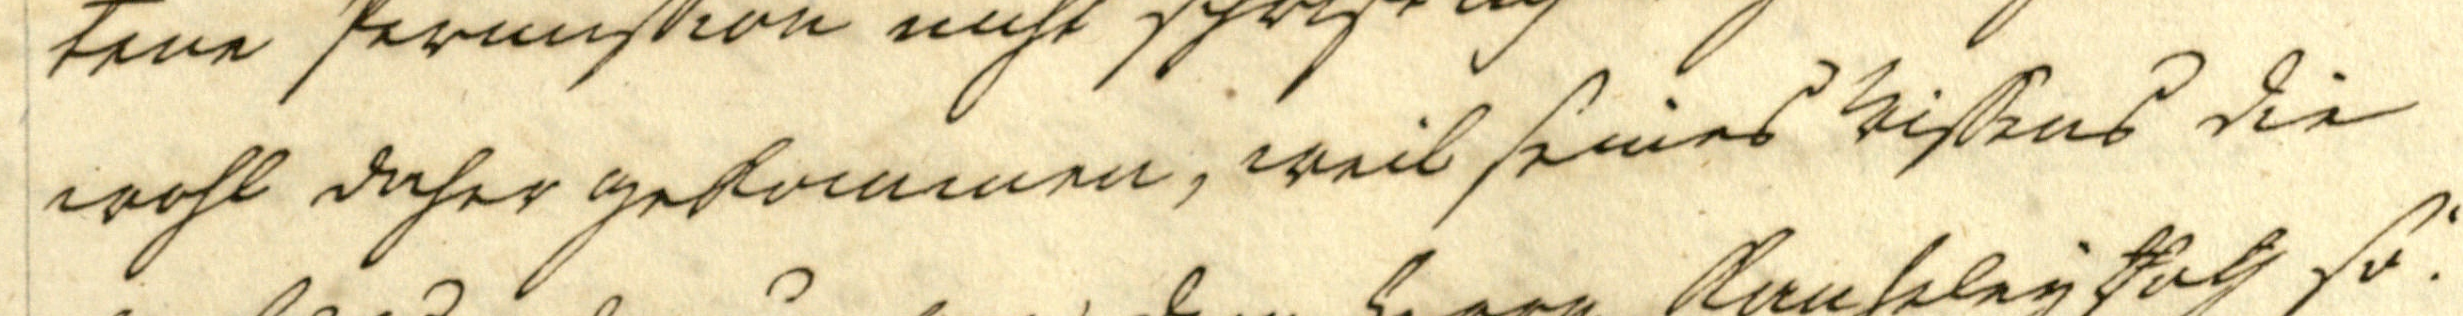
wohl daher gekommen, weil seines Wissens die
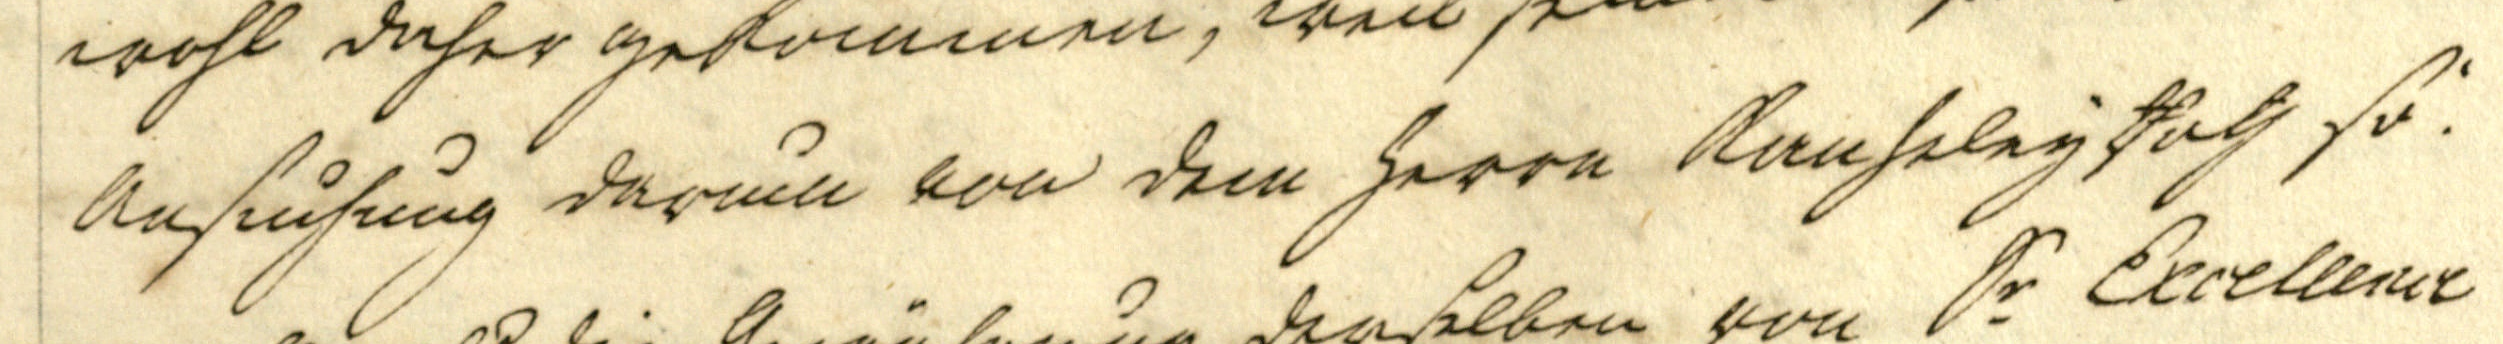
Ansuchung darum von dem Herrn KanzeleÿRath so¬
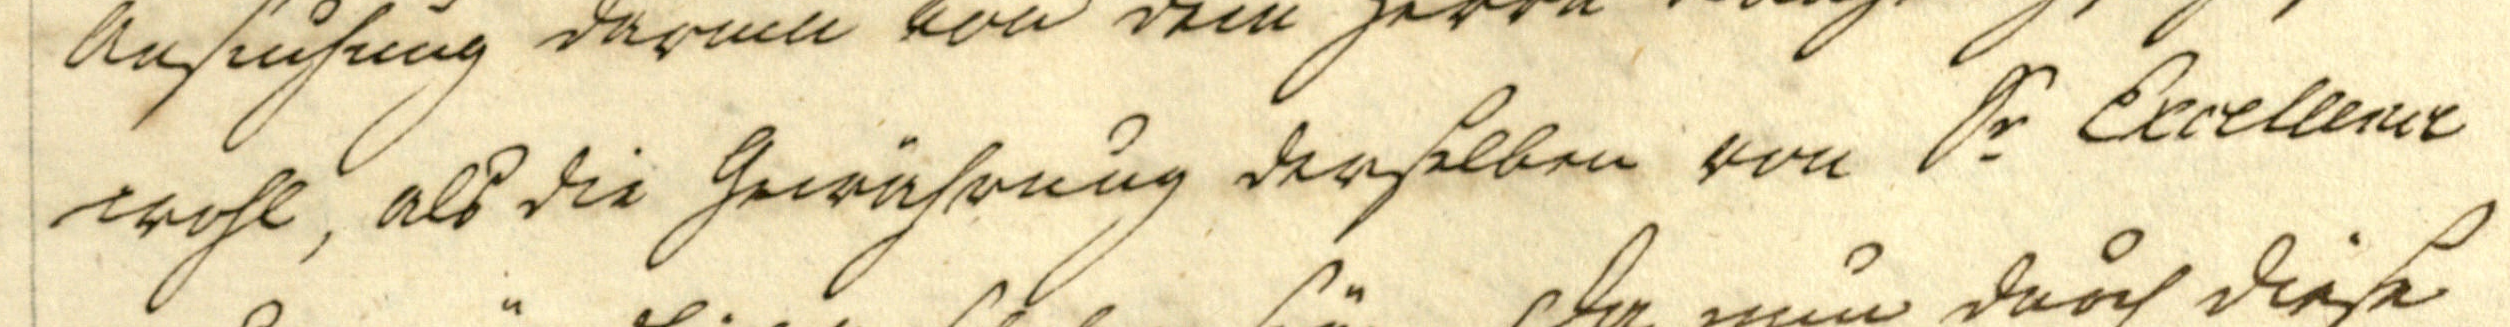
wohl, als die Gewährung derselben von Sr Excellence
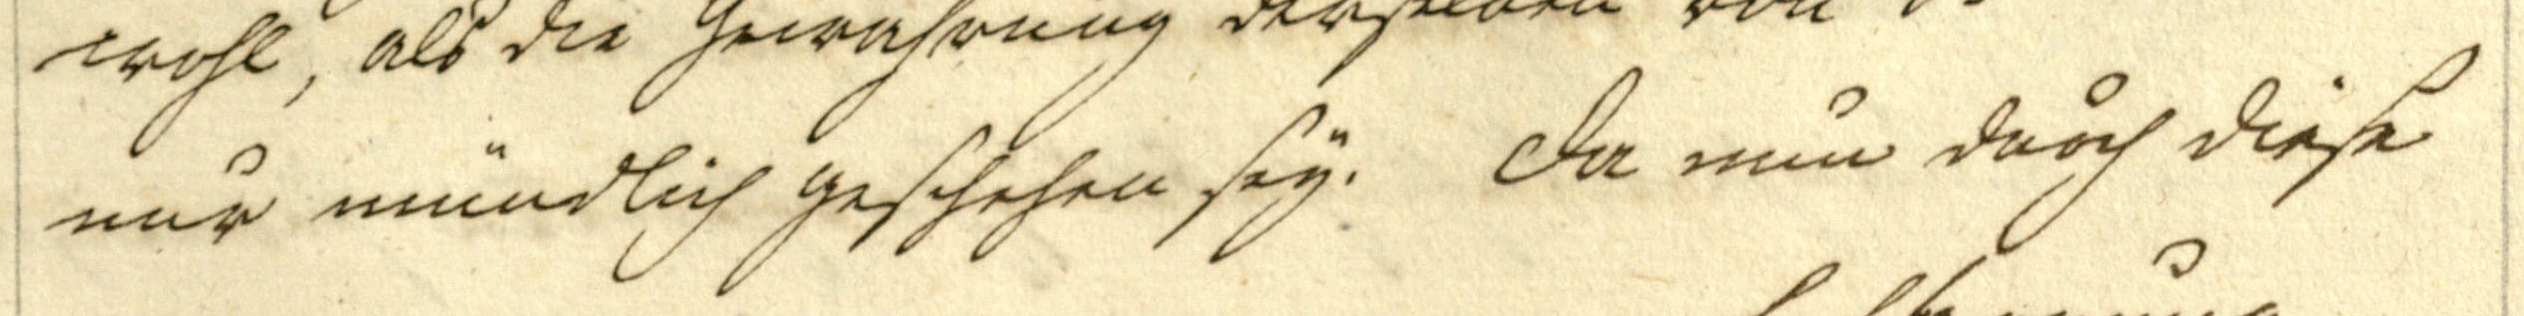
nur mündlich geschehen seÿ. Da nun durch diese
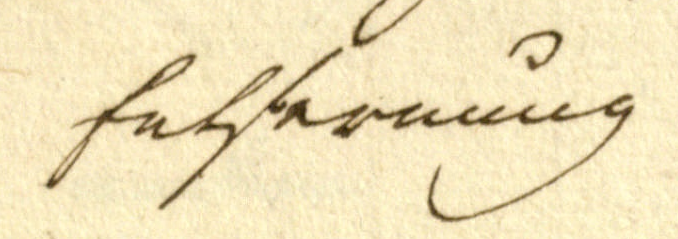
Entfernung
